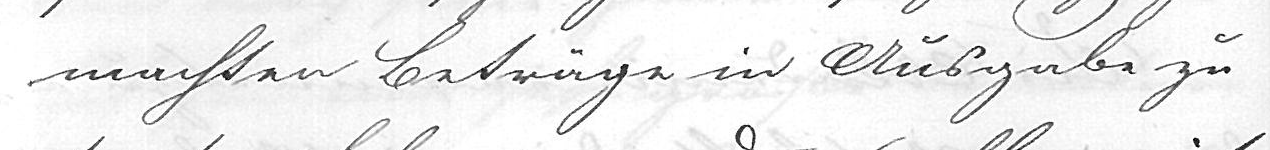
machten Beträge in Ausgabe zu
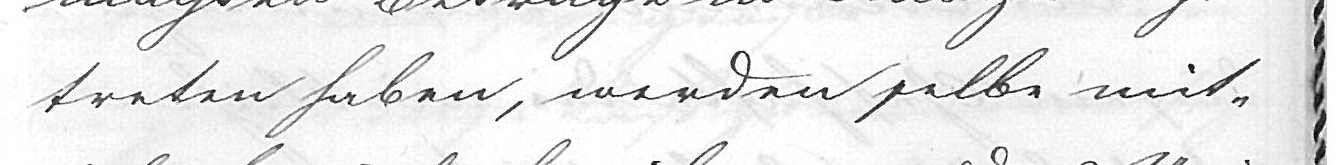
treten haben, werden selbe mit-
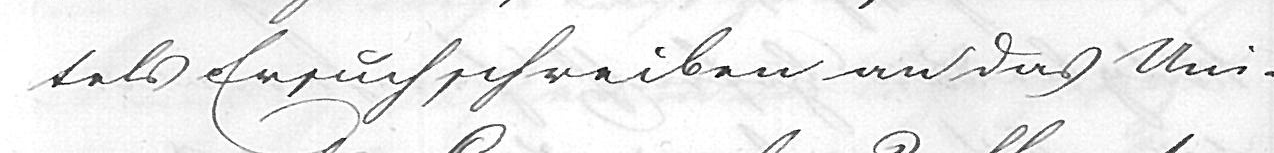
tels Ersuchschreiben an das Uni-
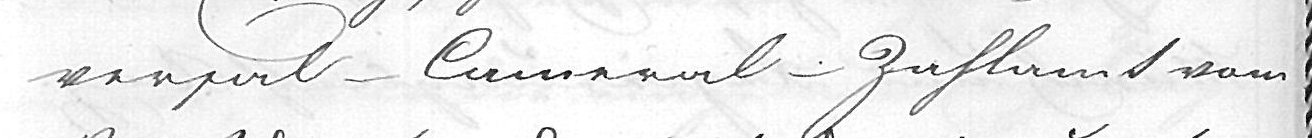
versal-Cameral-Zahlamt vom
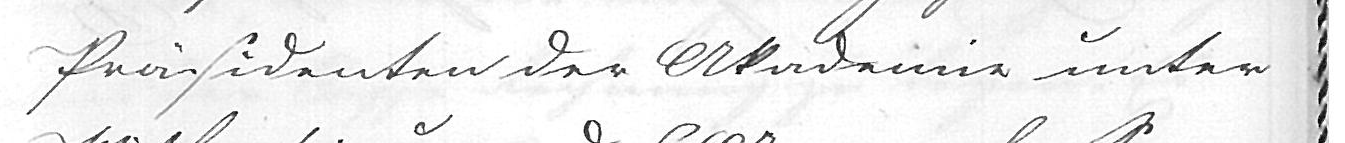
Präsidenten der Akademie unter
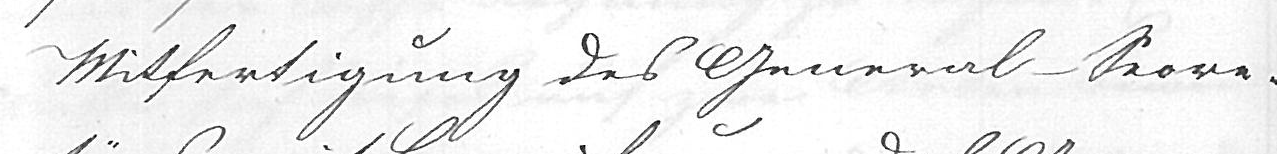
Mitfertigung des General-Secre-
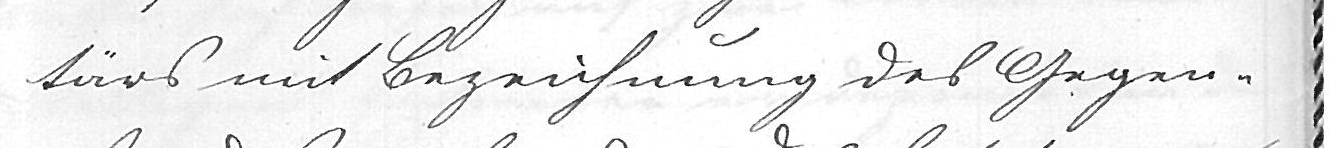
tär mit Bezeichnung des Gegen-
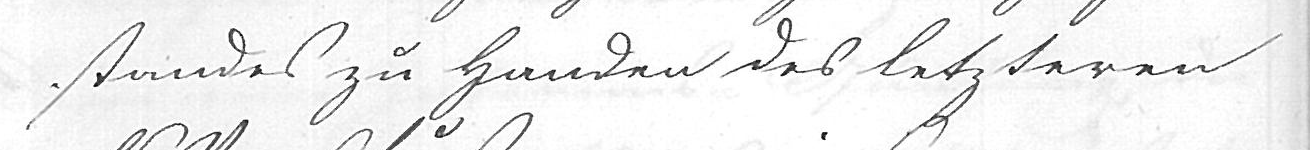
standes zu Handen des letzteren
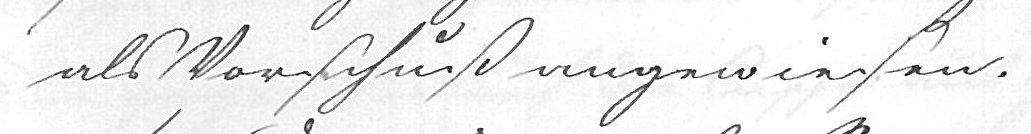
als Vorschluß angewiesen.
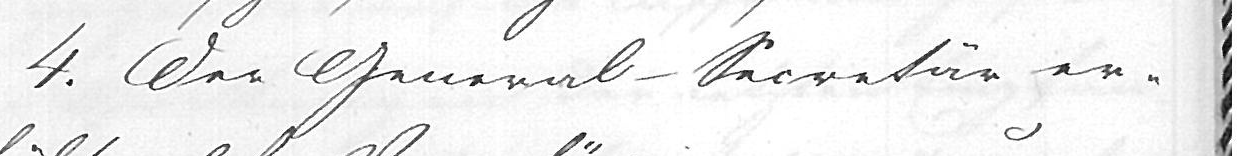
4. Der General-Secretär er-
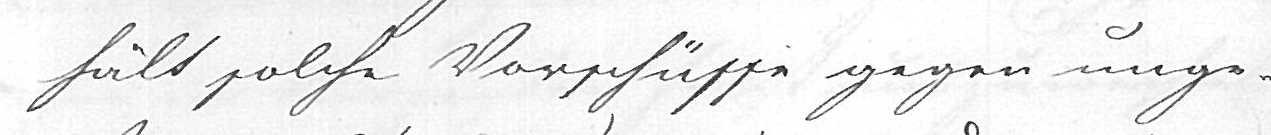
hält solche Vorschläge gegen unge-
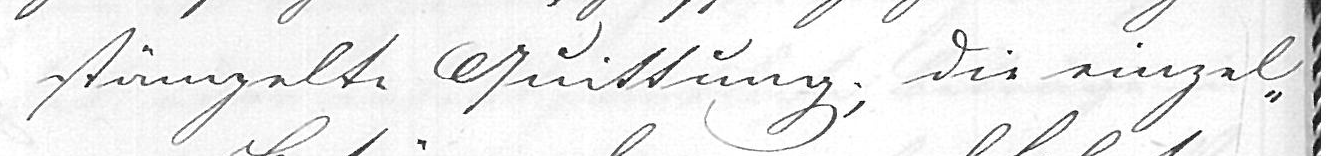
stämpelte Quittung; die einzel
